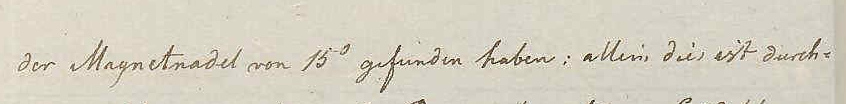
der Magnetnadel von 15° gefunden haben: allein dies ist durch-
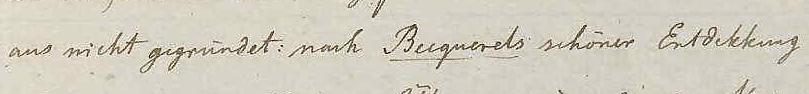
aus nicht gegründet: nach Becquerels schöner Entdekkung
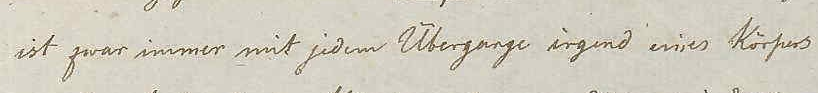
ist zwar immer mit jedem Übergange irgend eines Körpers
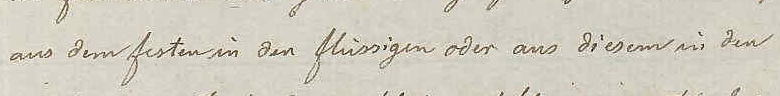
aus dem festen in den flüssigen oder aus diesem in den
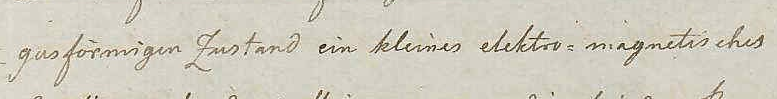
gasförmigen Zustand ein kleines elektro-magnetisches
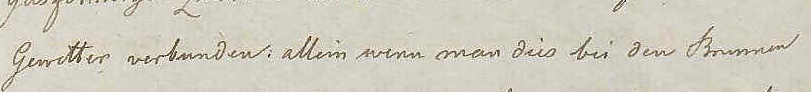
Gewitter verbunden: allein wenn man dies bei den Brunnen
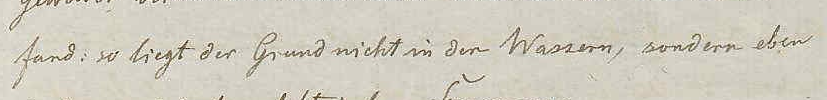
fand: so liegt der Grund nicht in den Wassern, sondern eben
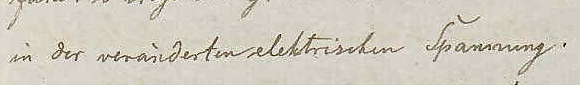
in der veränderten elektrischen Spannung.
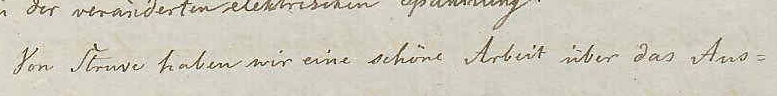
Von Struve haben wir eine schöne Arbeit über das Aus-
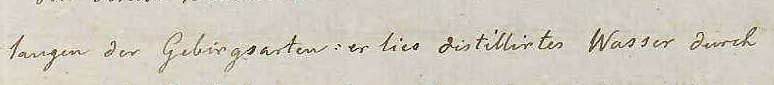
laugen der Gebirgsarten: er lies distillirtes Wasser durch
